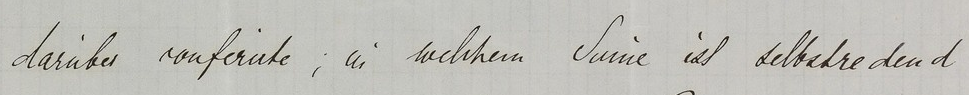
darüber conferirte; in welchem Sinne ist selbstredend.
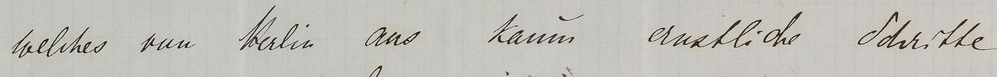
welches von Berlin aus kaum ernstliche Schritte
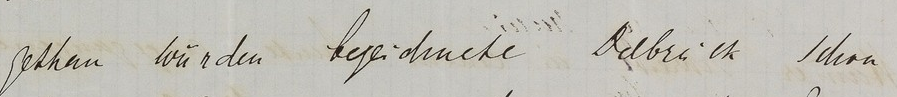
gethan wurden bezeichnete Delbrück schon
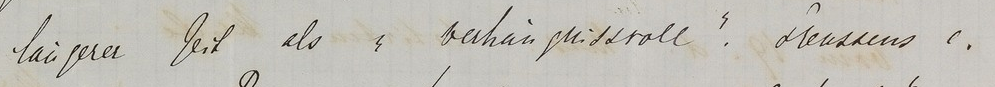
längerer Zeit als ‹verhängnissvoll›. Preussens e-
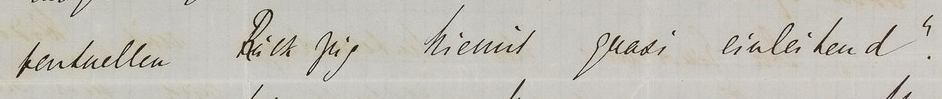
ventuellen Rückzug hiemit quasi einleitend.
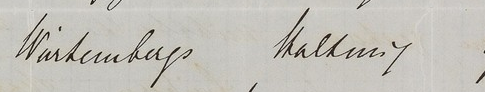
Würtembergs Haltung
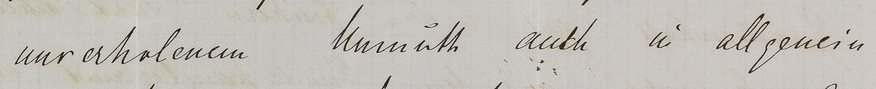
unverholenem Unmuth auch in allgemein
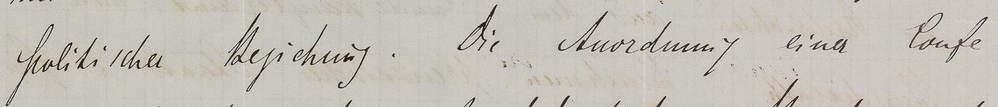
politischer Beziehung. Die Anordnung einer Confe-
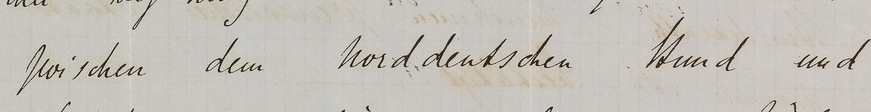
zwischen dem norddeutschen Bund und
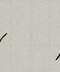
den
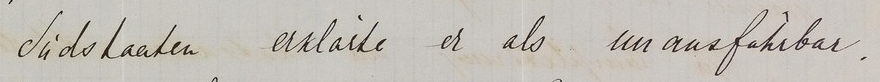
Südstaaten erklärte er als unausführbar.
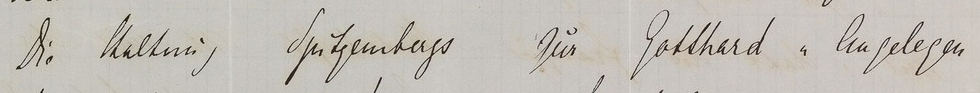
Die Haltung Spitzembergs zur Gotthard-Angelegen-
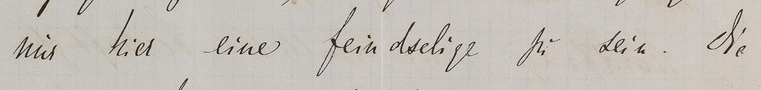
mir hier eine feindselige zu sein. Die
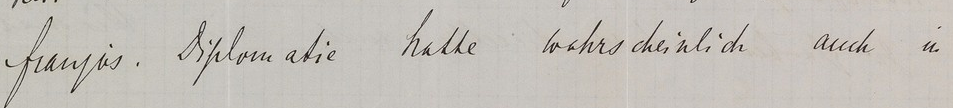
französ. Diplomatie hatte wahrscheinlich auch in
